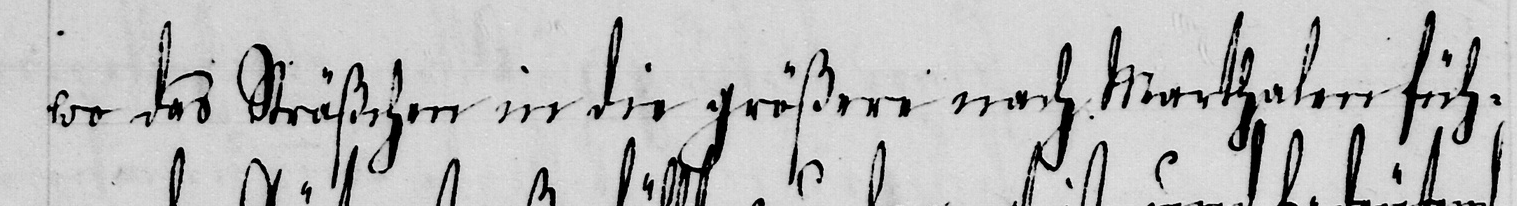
wo das Sträßchen in die größere nach Marthalen füh¬
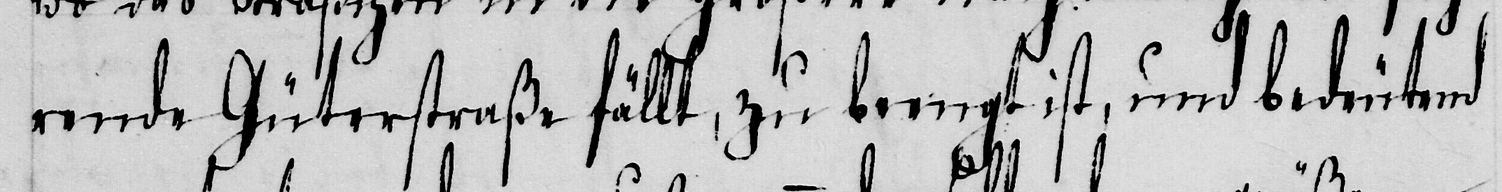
rende Güterstraße fällt, zu beengt ist, und bedeutend
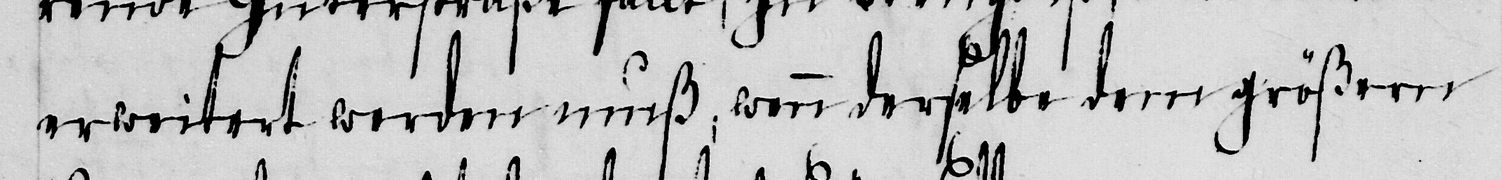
erweitert werden muß, wenn derselbe dem größern
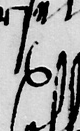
1.)
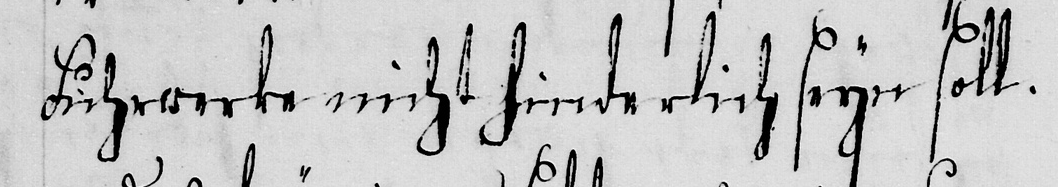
Fuhrwerke nicht hinderlich seyn sol¬
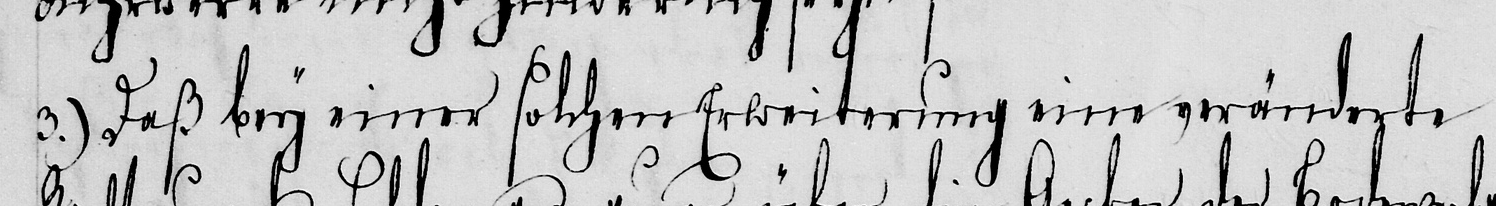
3.) Daß bey einer solchen Erweiterung eine veränderte
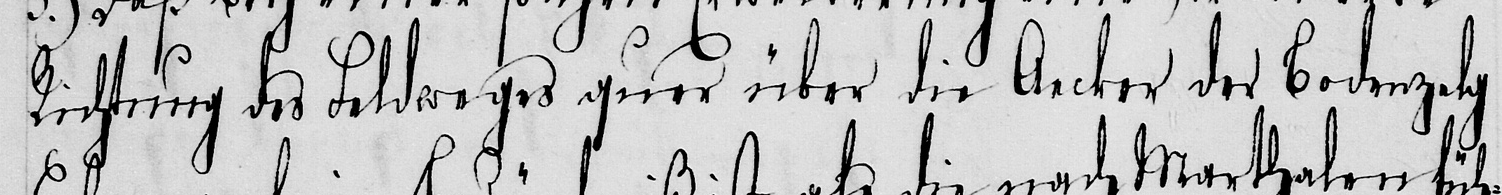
Richtung des Feldweges quer über die Aecker der Bodenzelg
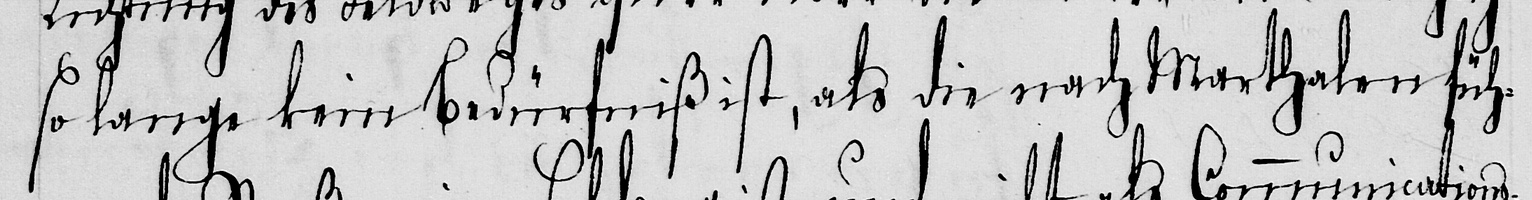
so lange kein Bedürfniß ist, als die nach Marthalen füh¬
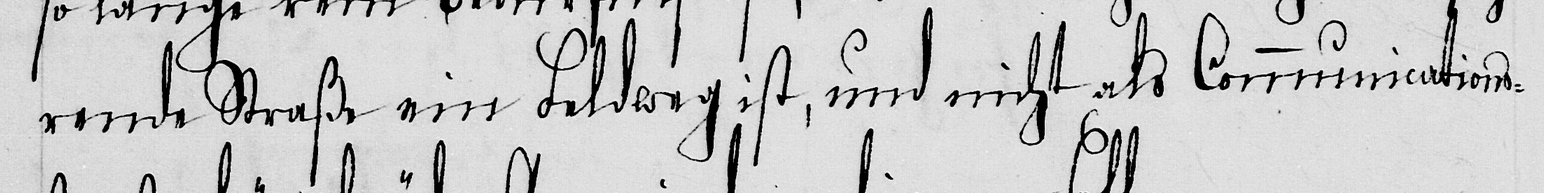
rende Straße ein Feldweg ist, und nicht als Communications¬
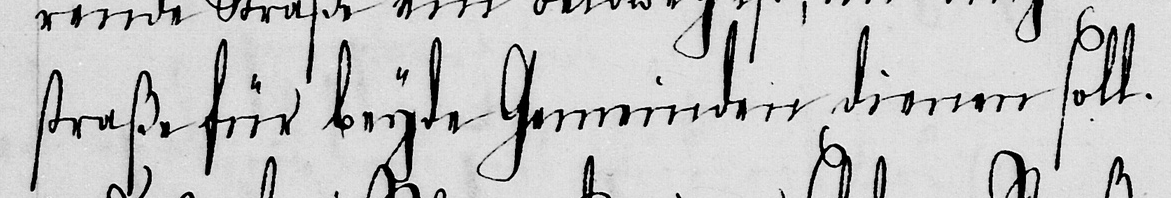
straße für beyde Gemeinden dienen soll.
